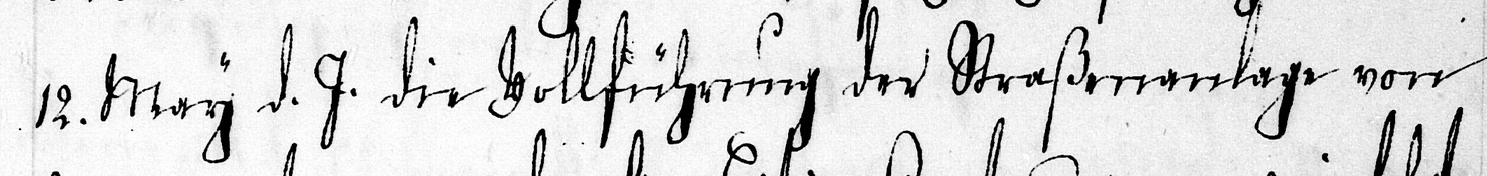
12. May d. J. die Vollführung der Straßenanlage von
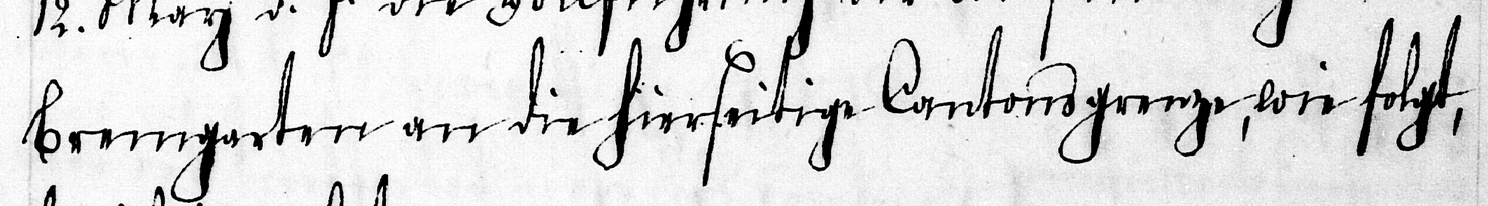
Bremgarten an die hierseitige Cantonsgrenze, wie folgt,
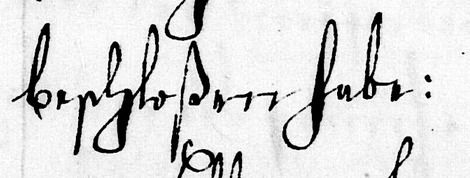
beschloßen habe:
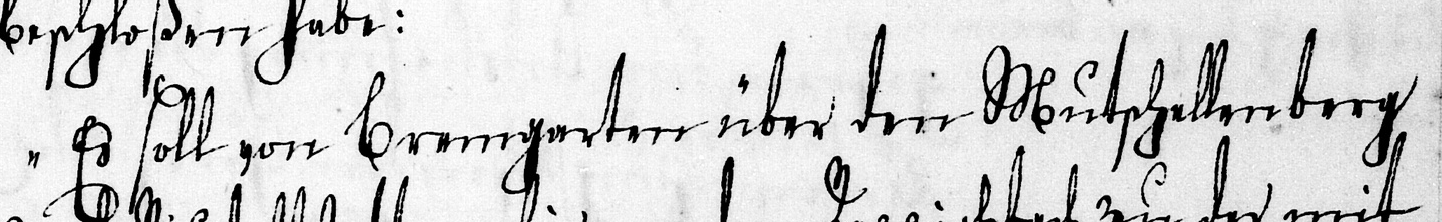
„Es soll von Bremgarten über den Mutschellenberg
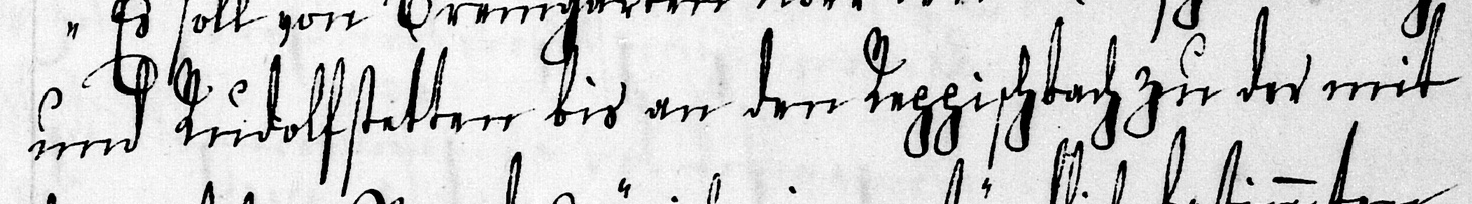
und Rudolfstetten bis an den Reppischbach zu der mit
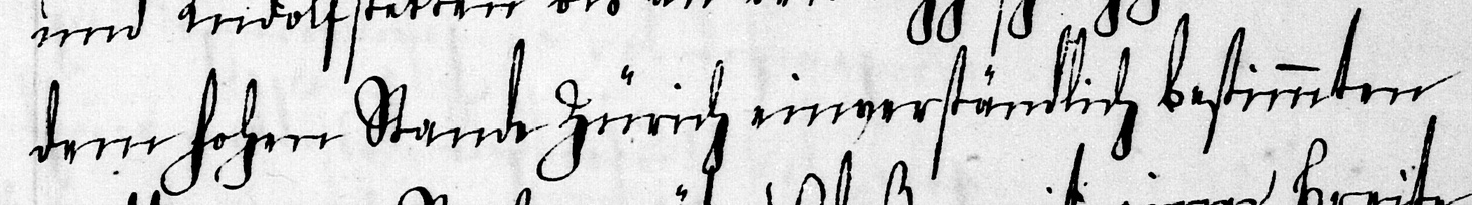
dem hohen Stande Zürich einverständlich bestimmten
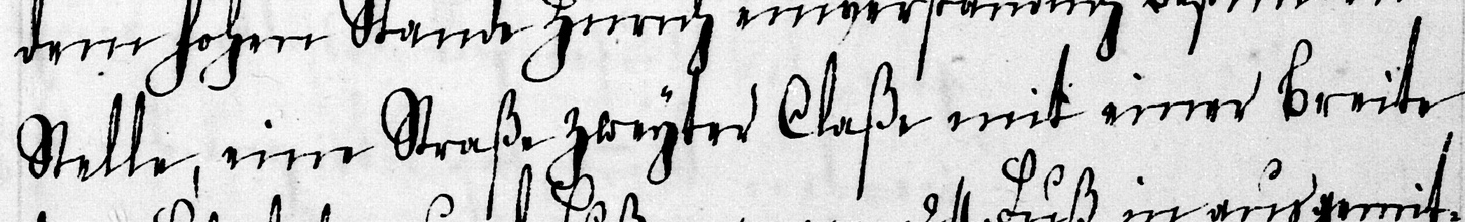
Stelle, eine Straße zweyter Claße mit einer Breite
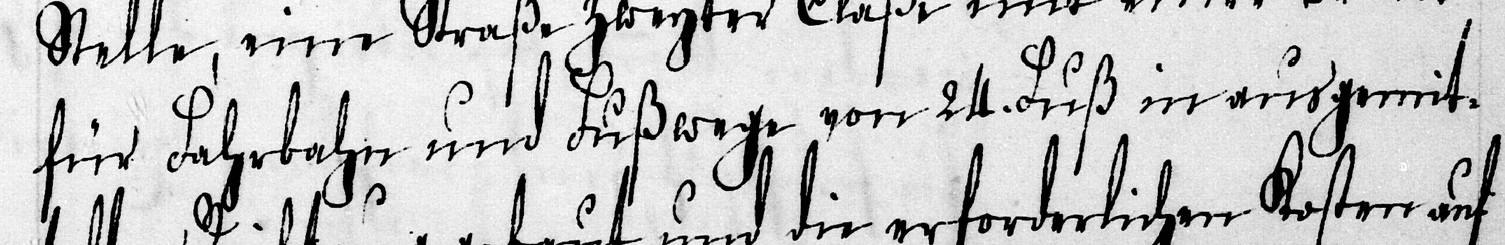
für Fahrbahn und Fußwege von 24. Fuß in ausgemit¬
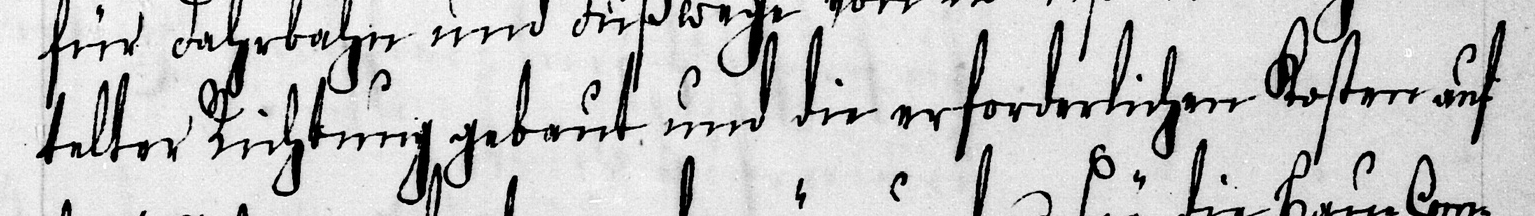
telter Richtung gebaut und die erforderlichen Kosten auf
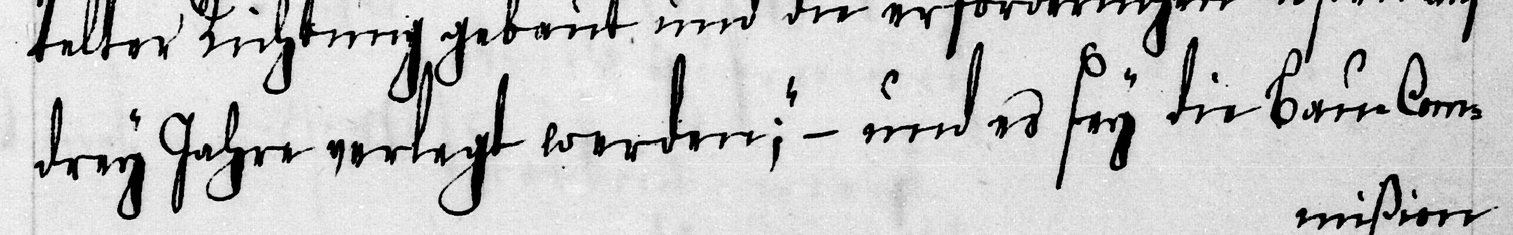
drey Jahre verlegt werden;“ – und es sey die Bau-Com-
